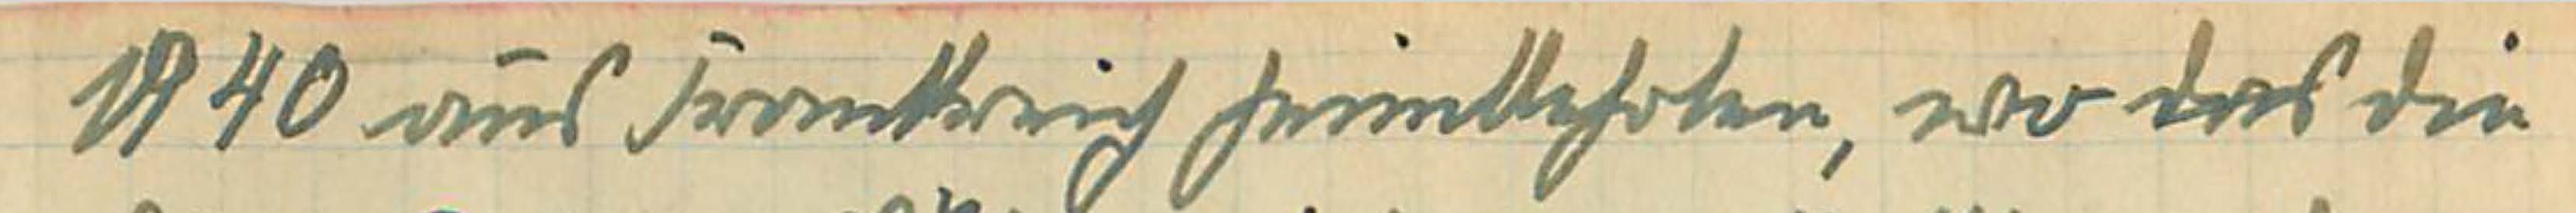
1940 aus Frankreich heimkehrten, wo das die
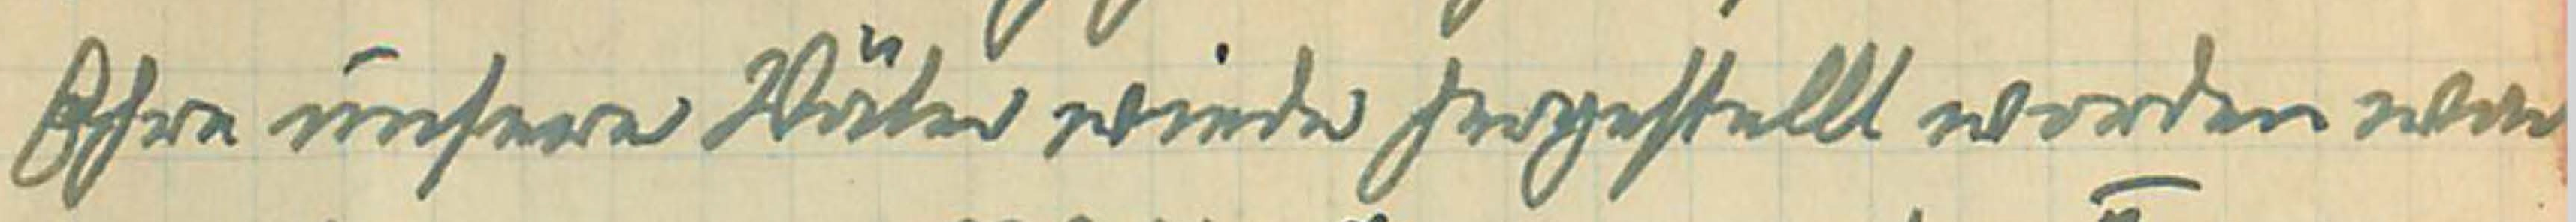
Ehre unsrer Väter wieder hergestellt worden war
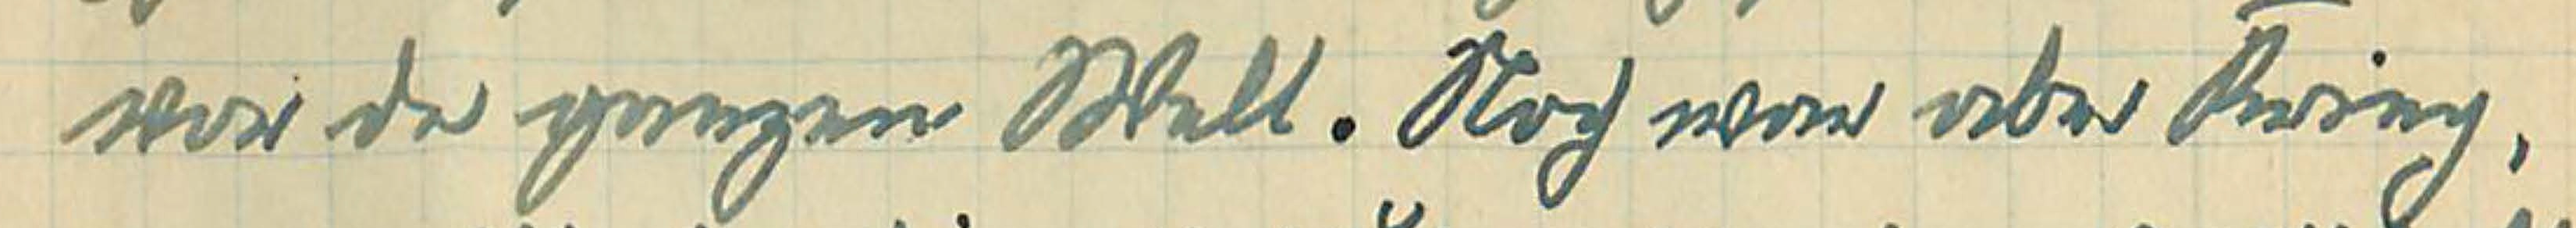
vor der ganzen Welt. Noch war aber Krieg,
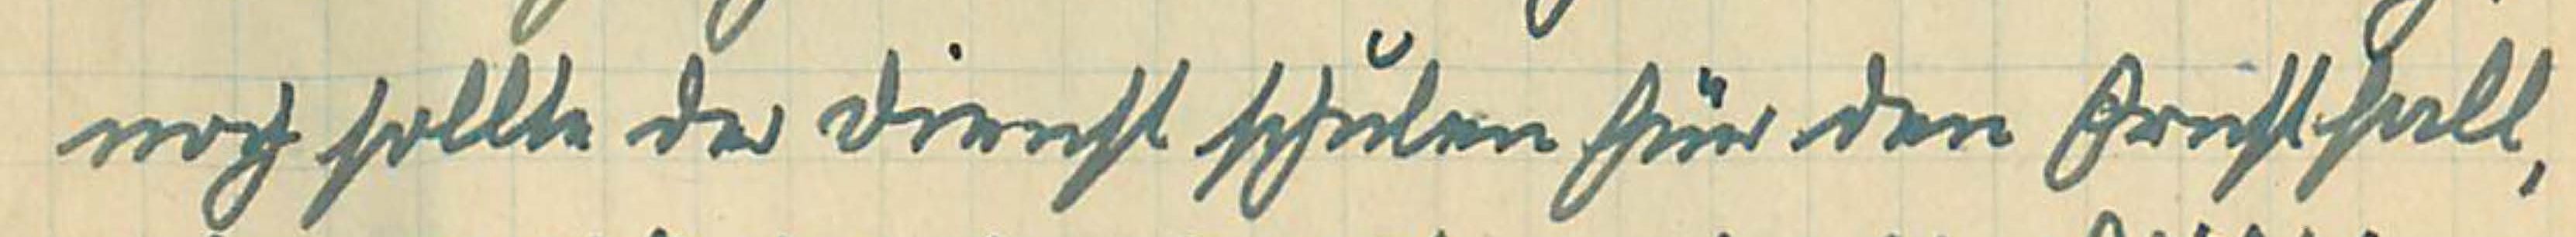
noch sollte der Dienst schulen für den Ernstfall,
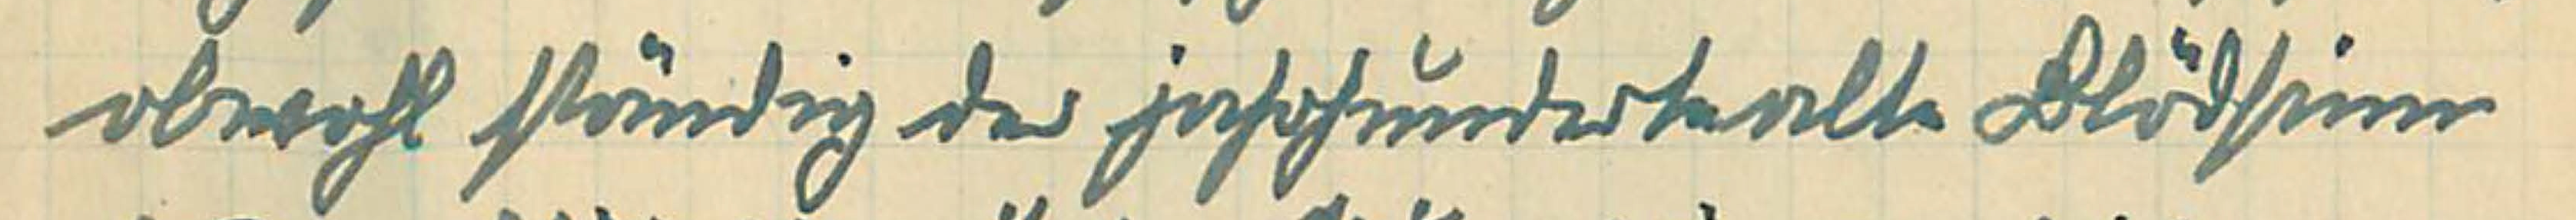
obwohl ständig der jahrhundertealte Blödsinn
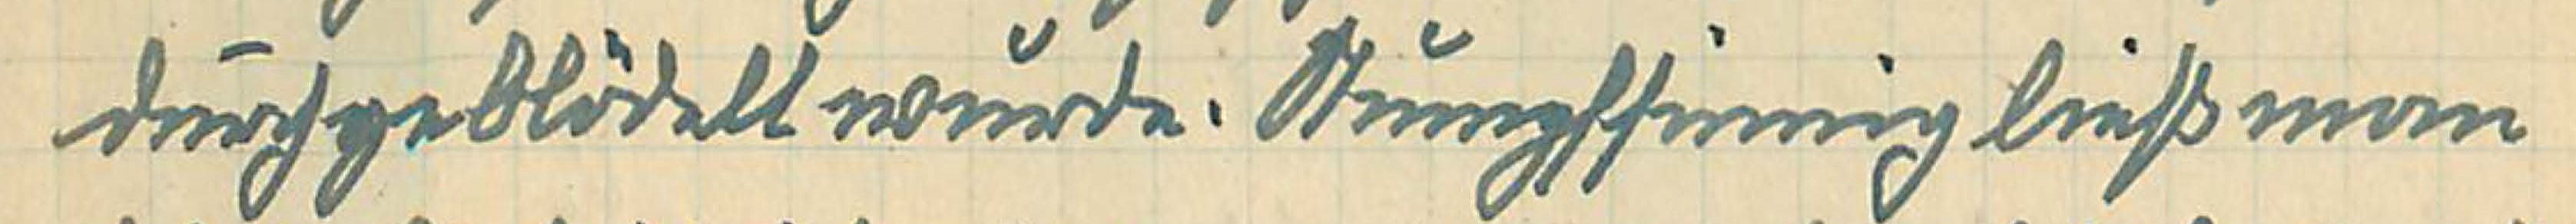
durchgeblödelt wurde. Stumpfsinnig ließ man
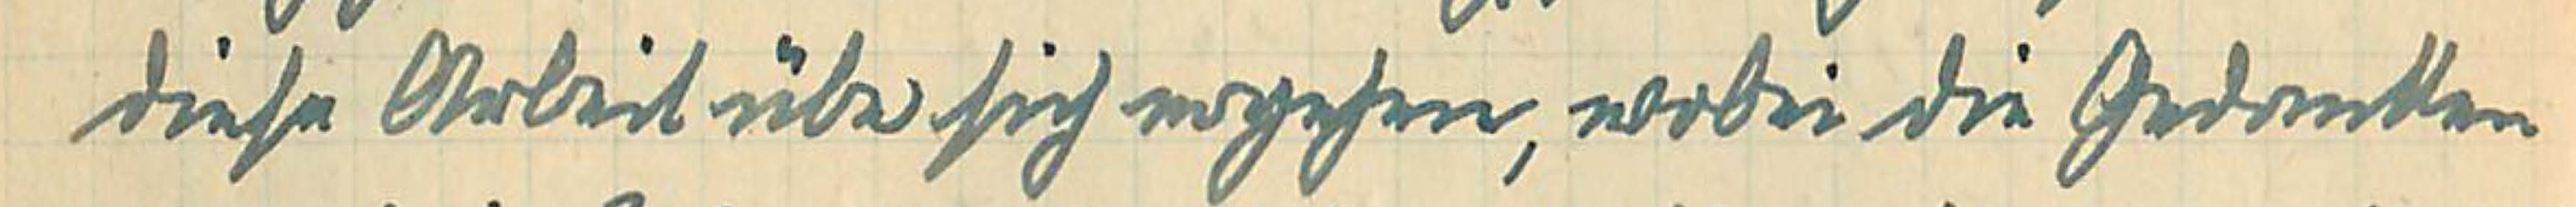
diese Arbeit über sich ergehen, wobei die Gedanken
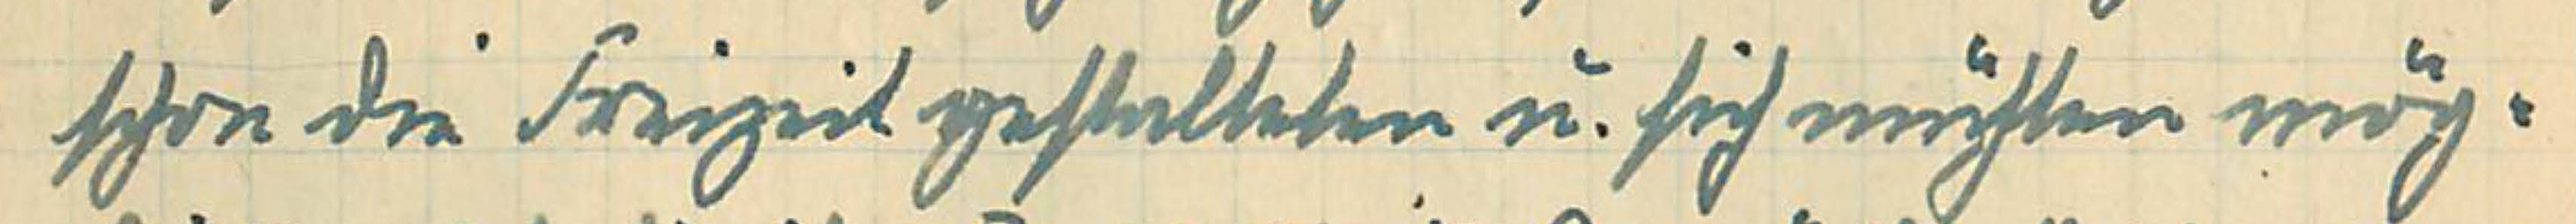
schon die Freizeit gestalteten u. sich mühten mög-
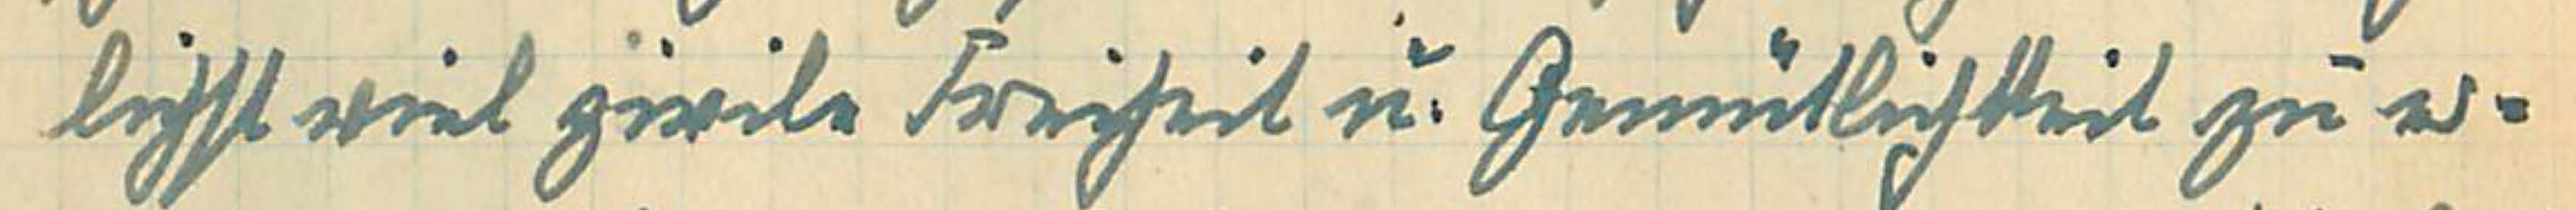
lichst viel zivile Freiheit u. Gemütlichkeit zu er-
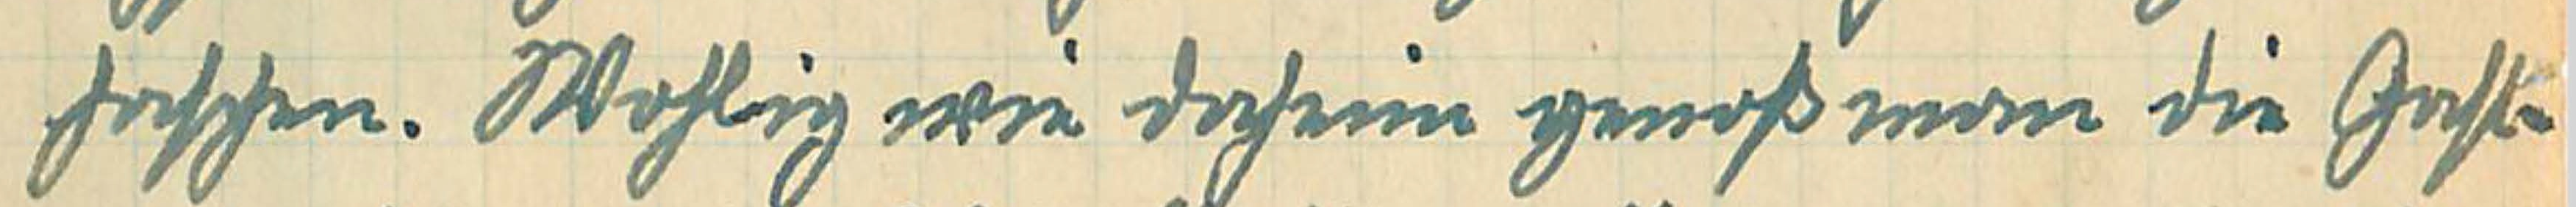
haschen. Wohlig wie daheim genoß man die Gast-
